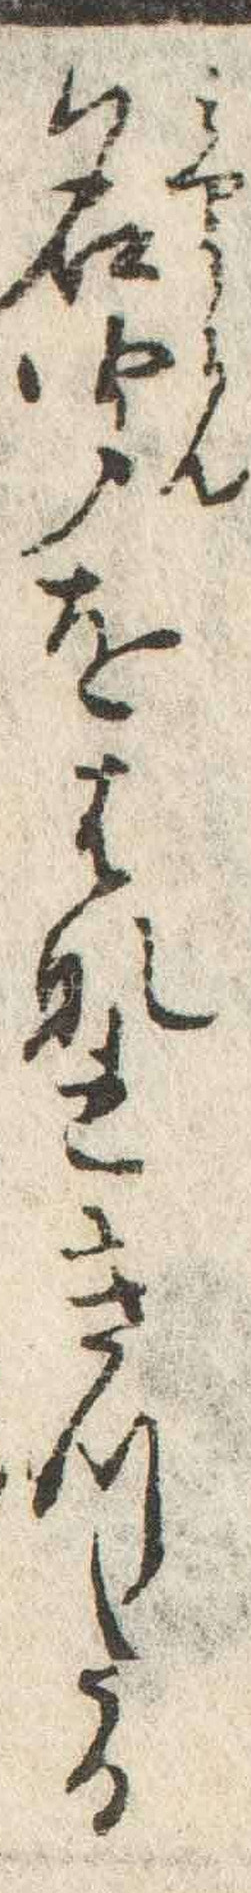名聞をはなれきつたる
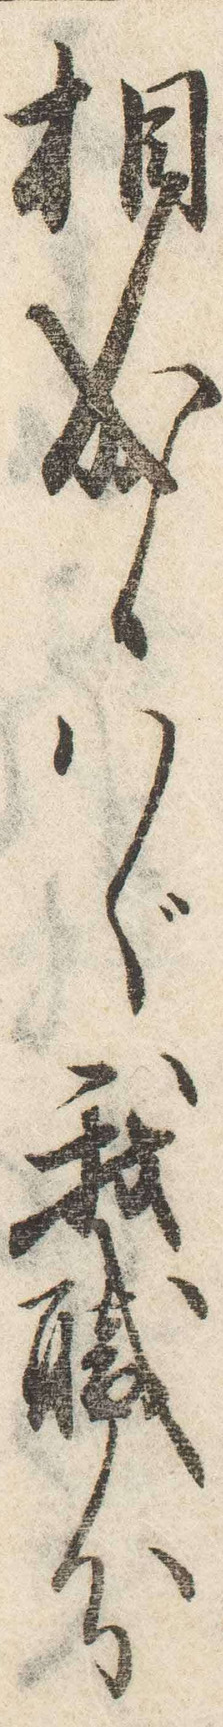相成候はゞ我職分
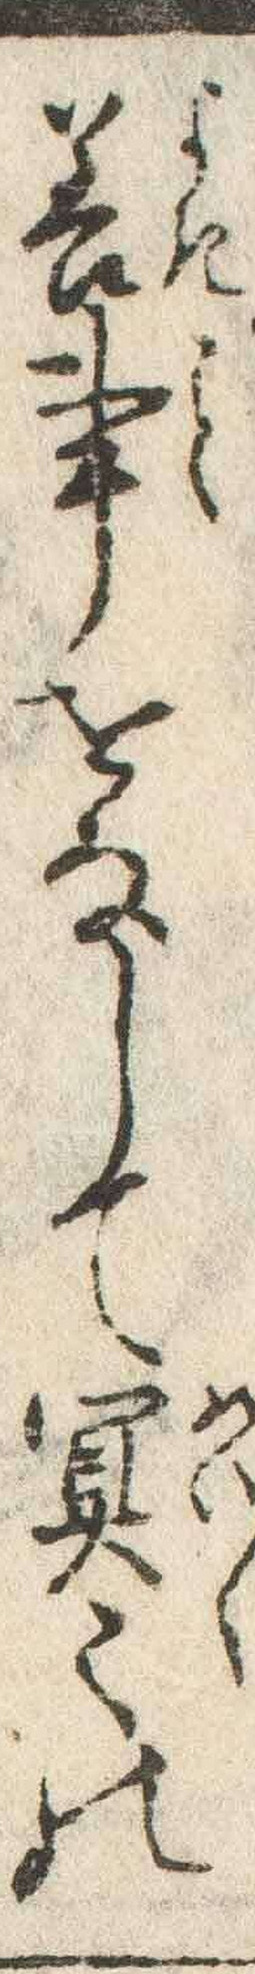善事をなして冥々の
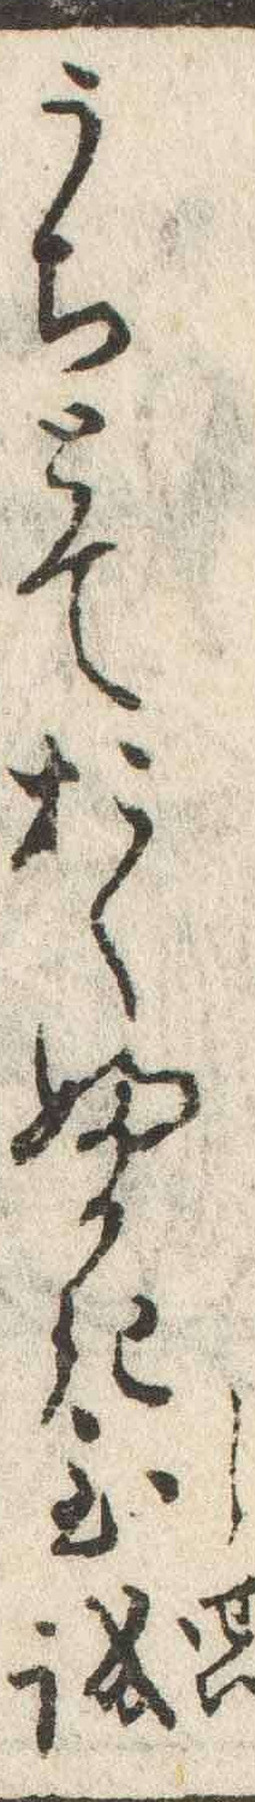うちとておくふかき至誠
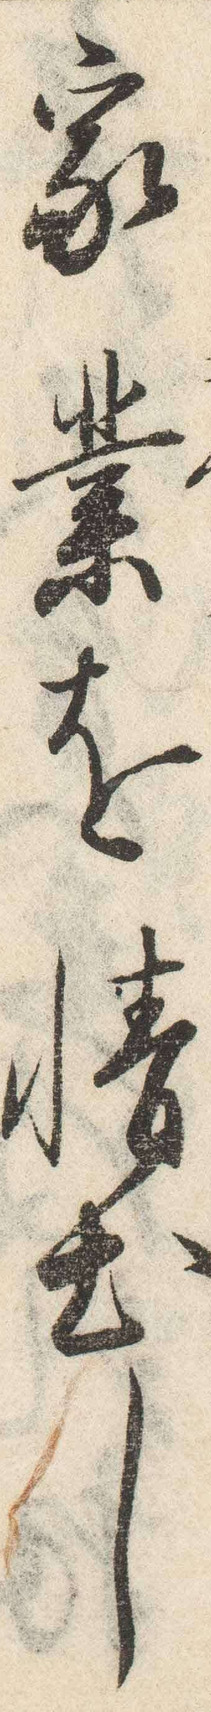家業を情出し
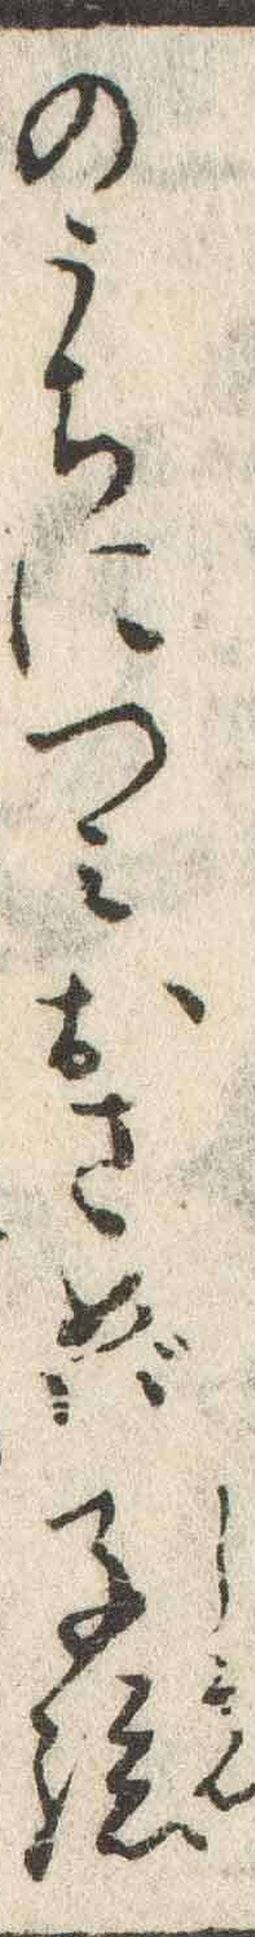のうちにつみおさめば子孫
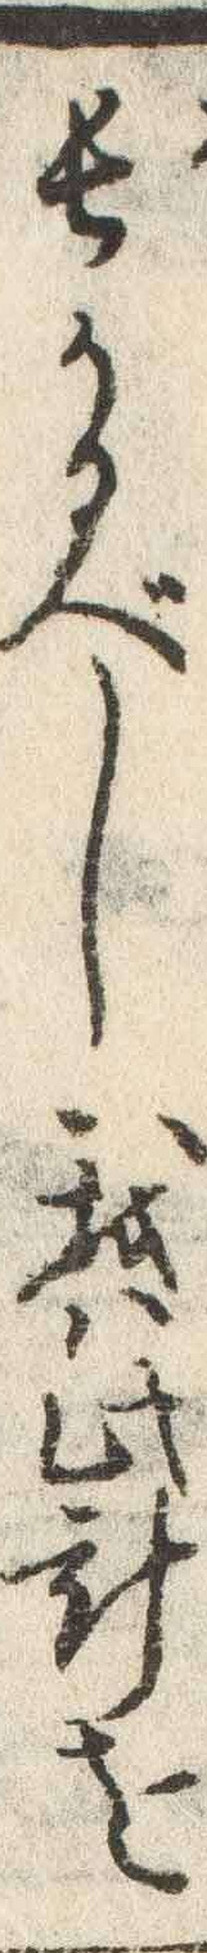長かるべし我は此計を
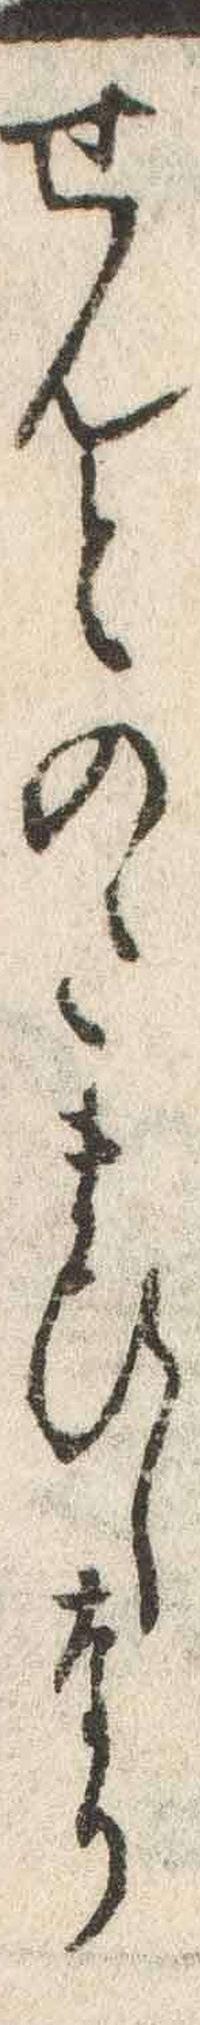せんとのたまひしなり
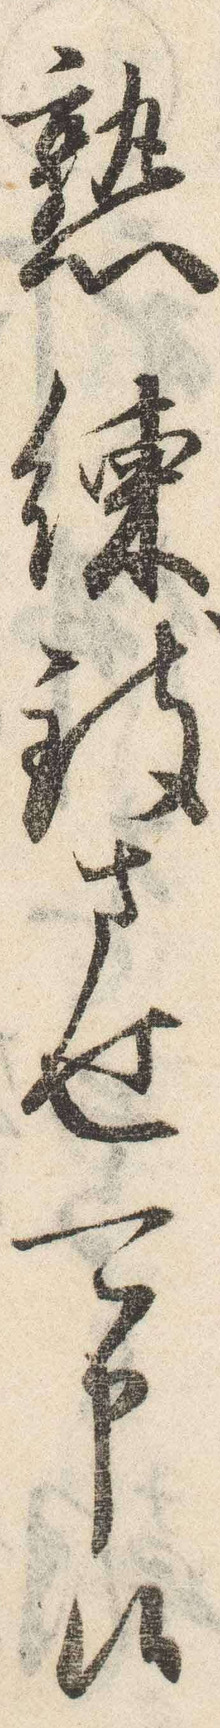熟練致させ可申候
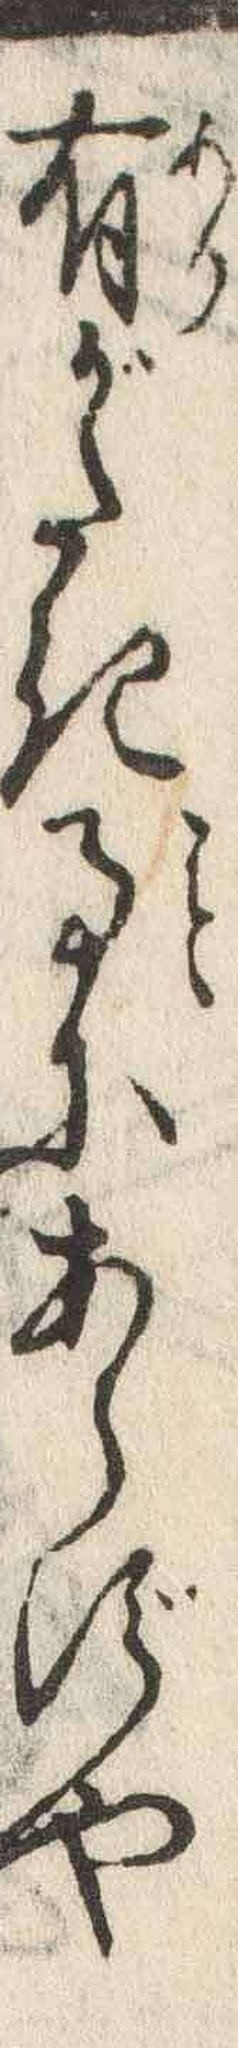有がたき事にあらずや
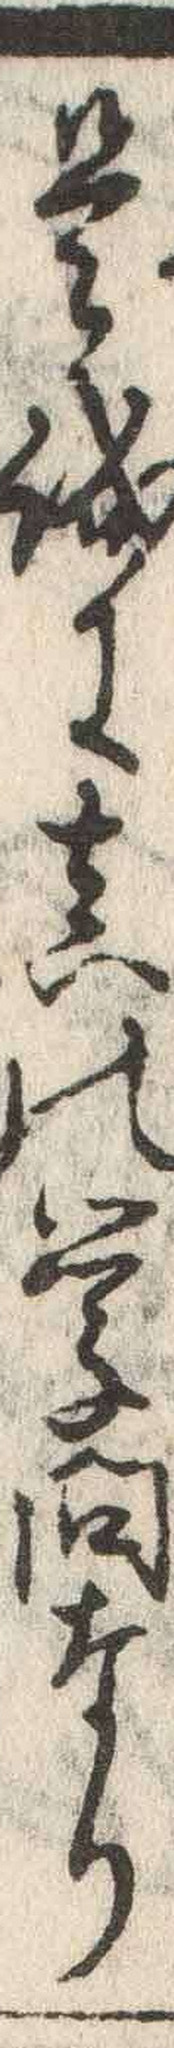是誠に真の学問なり
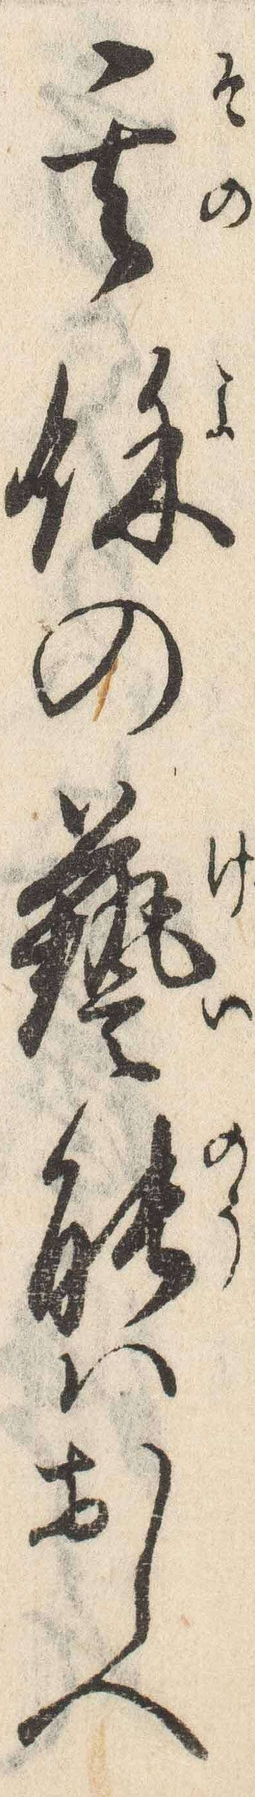其余の芸能はおしへ
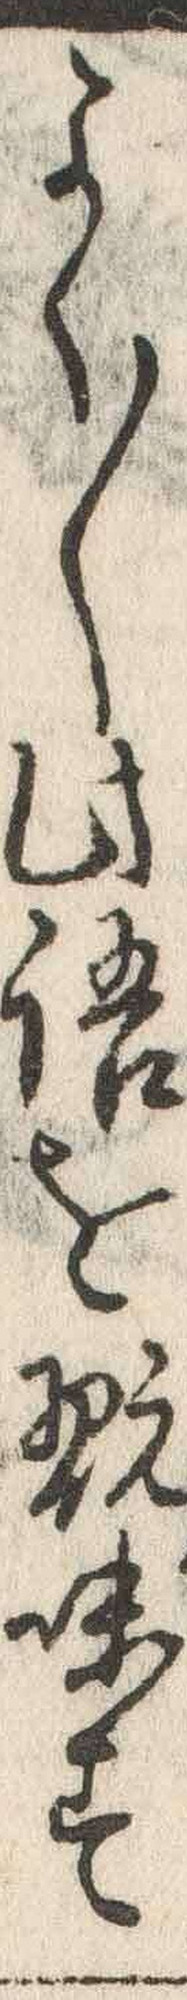よく〳〵此語を翫味す
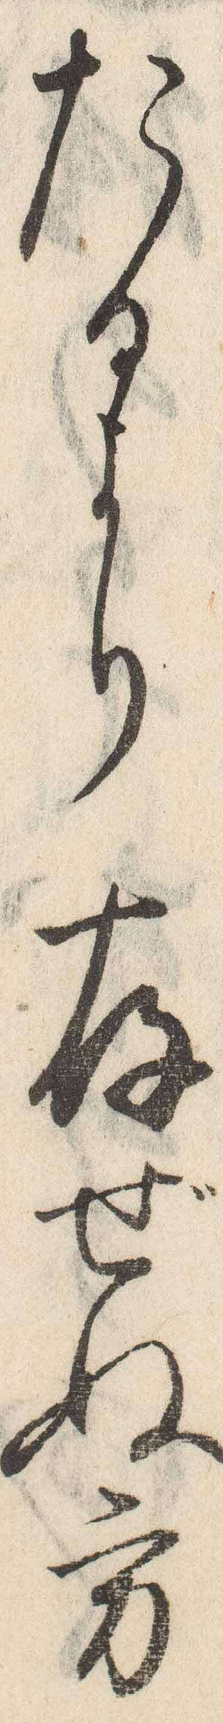たるより存ぜぬ方
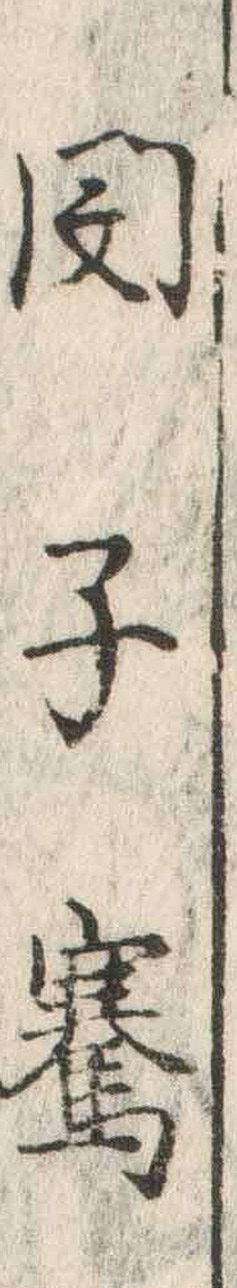閔子騫
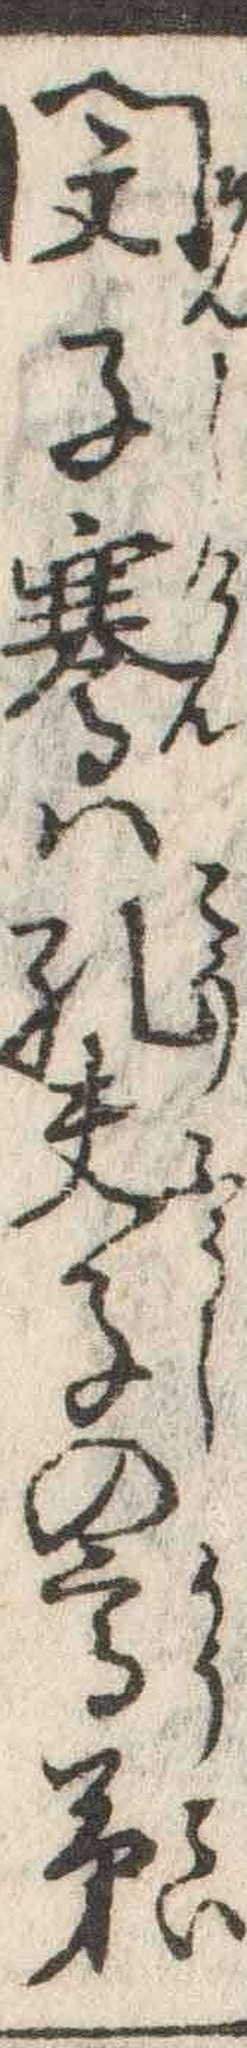閔子騫は孔夫子の高弟
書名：撫育草
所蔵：東京学芸大学附属図書館 国文学研究資料館
